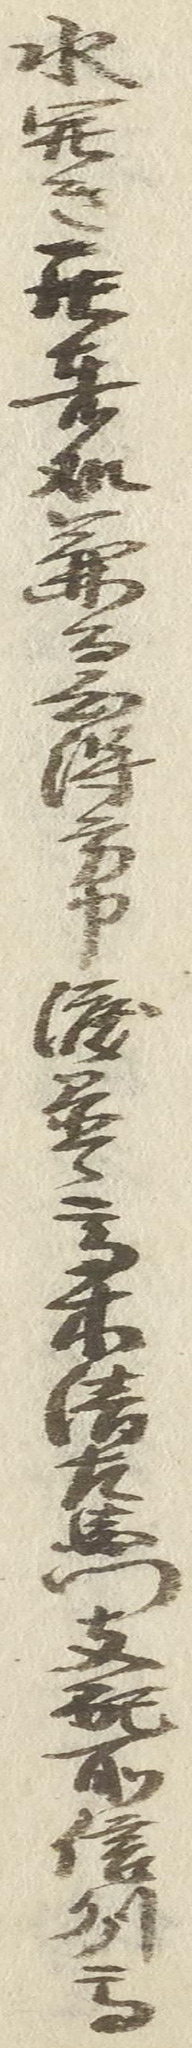水開き罷在候処兼而心得方申渡置候髙木清左衛門支配所信州高

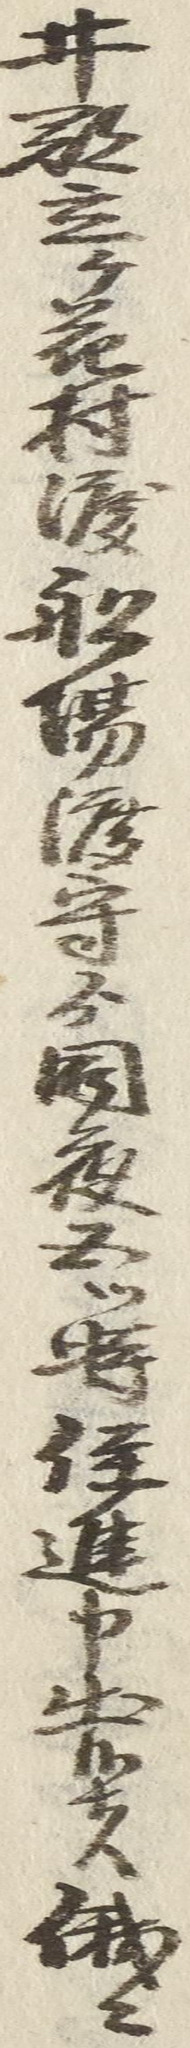井郡立ヶ花村渡船場渡守ゟ同夜五ッ時注進震出候は俄二
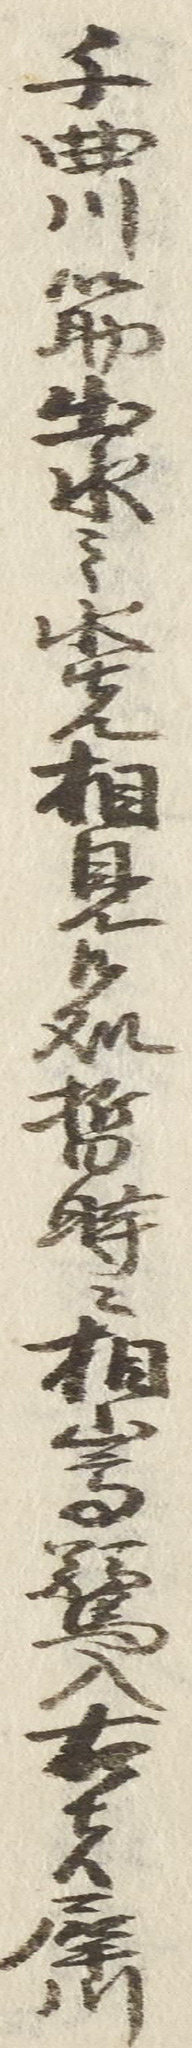千曲川筋出水之水先相見候処暫時二水嵩驚入右は犀川
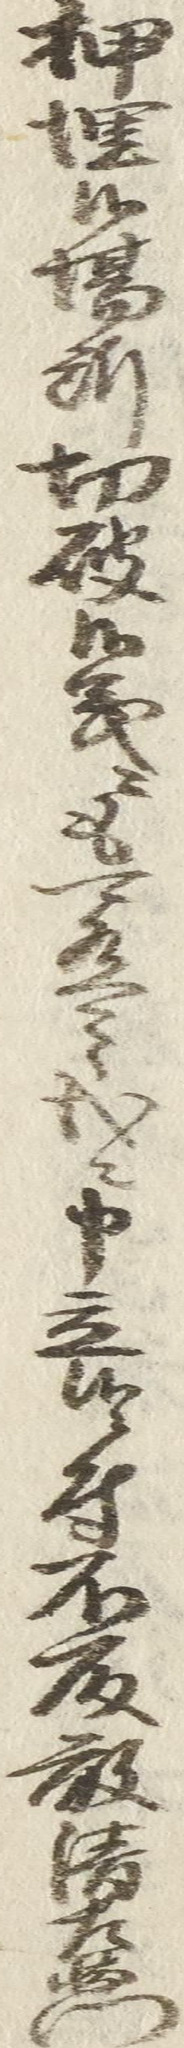押埋侯場所切破侯義二も可有之哉二申立候二付不取敢清右衛門
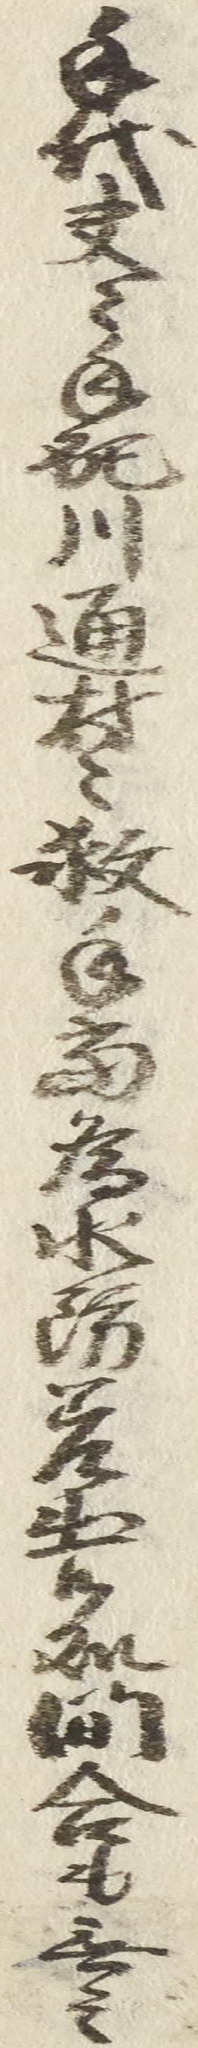手代夫々手配川通村々救手当為水防差出候処間合も無之
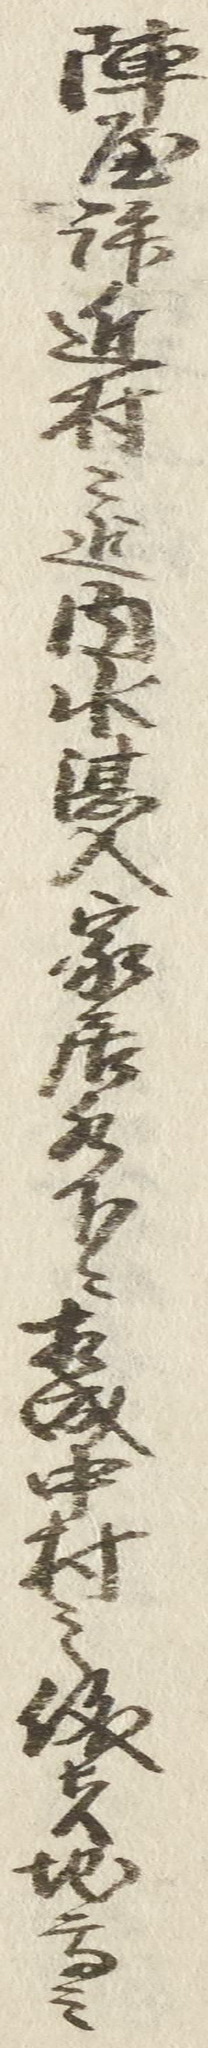陣屋許近村二迄内水湛入家居水下二相成中村之儀は地高之
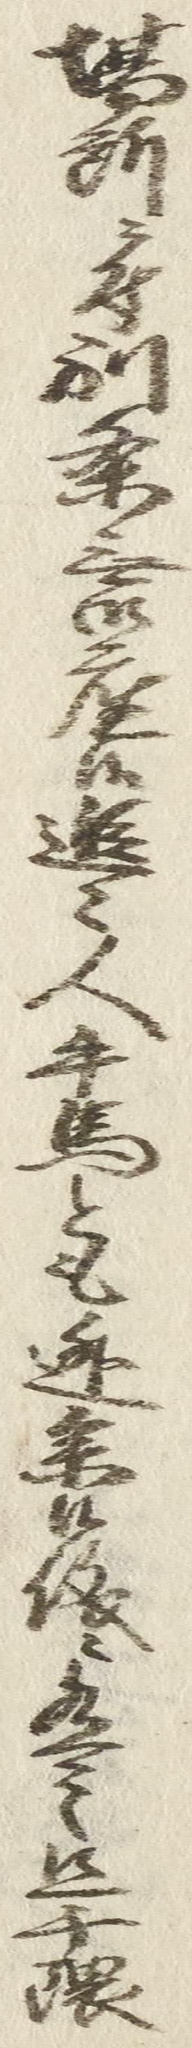場所二付別条無御座候追々人牛馬とも逃参候儀二有之且千隈
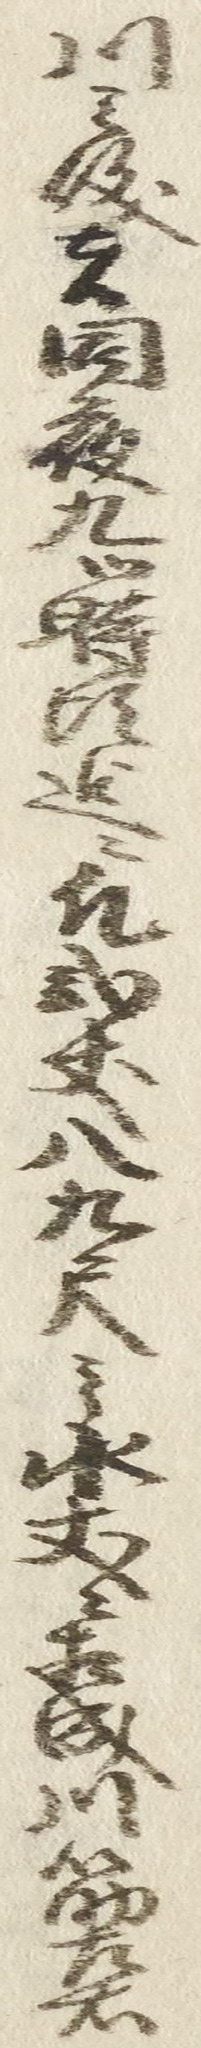川の儀は同夜九ッ時頃迄二凡弐丈八九尺之水丈二相成川筋左右
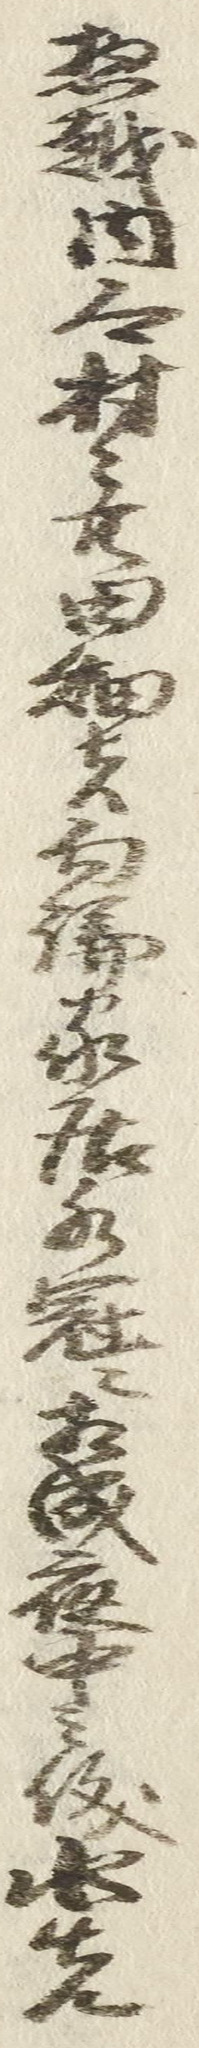惣越内郷村々共田畑は勿論家居水冠二相成夜中之儀水先
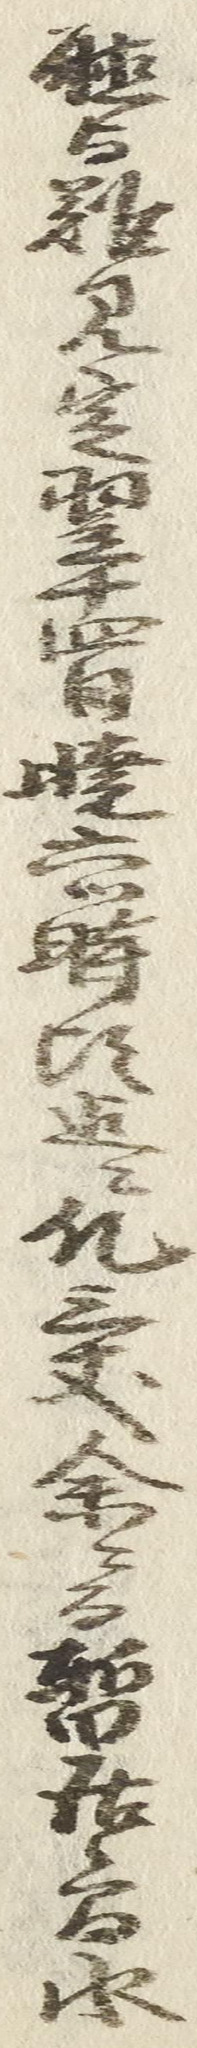聢と難見定翌十四日暁六ッ時頃迄二凡三丈余二而暫居候間水
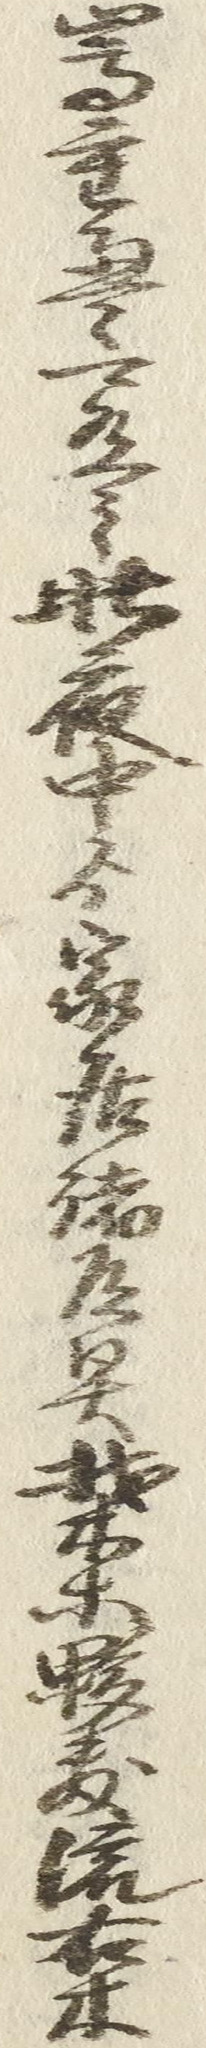嵩重畳可有之時夜中ゟ家居諸道具材木等夥敷流右木
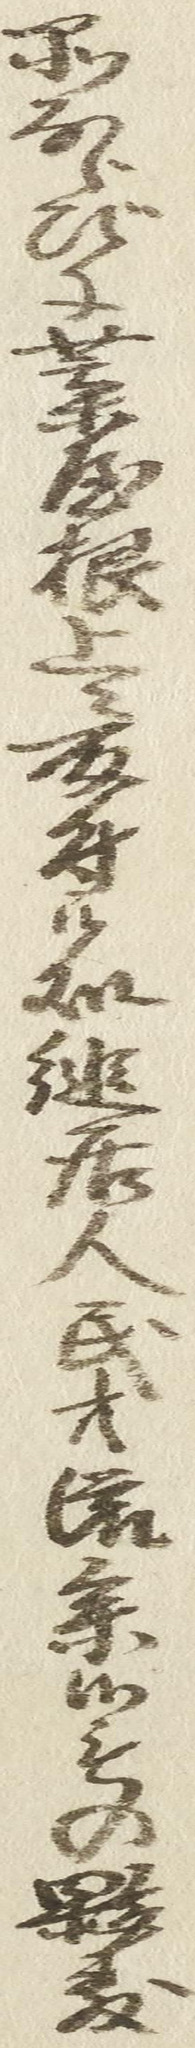品ならびに藁屋根上二取付候処縋居人民共流参候もの夥敷
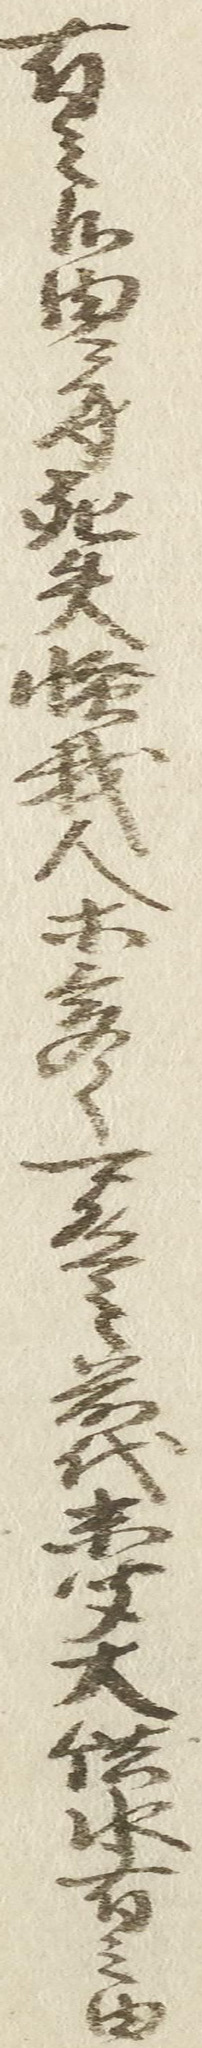有之候由二付死失怪我人等多く可有之前代未聞大洪水有之由
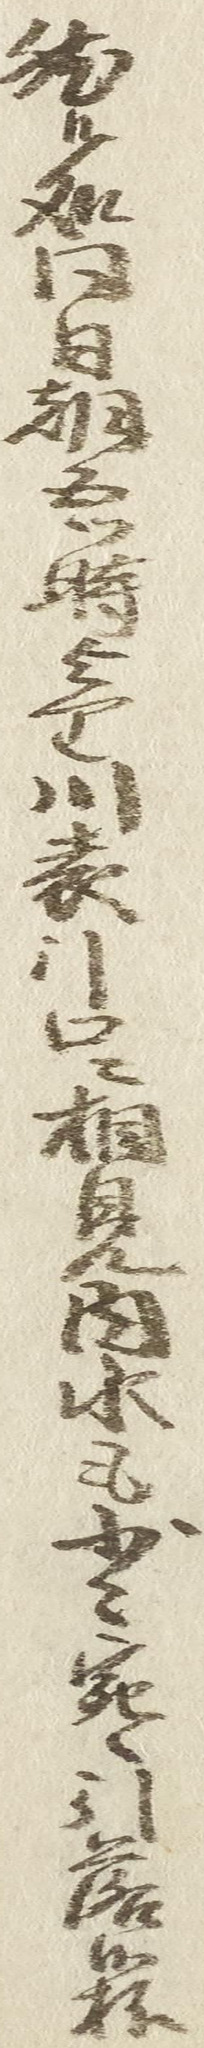然ㇽ処同日朝五ッ時より川表引口に相見内水も少々宛々引落候様
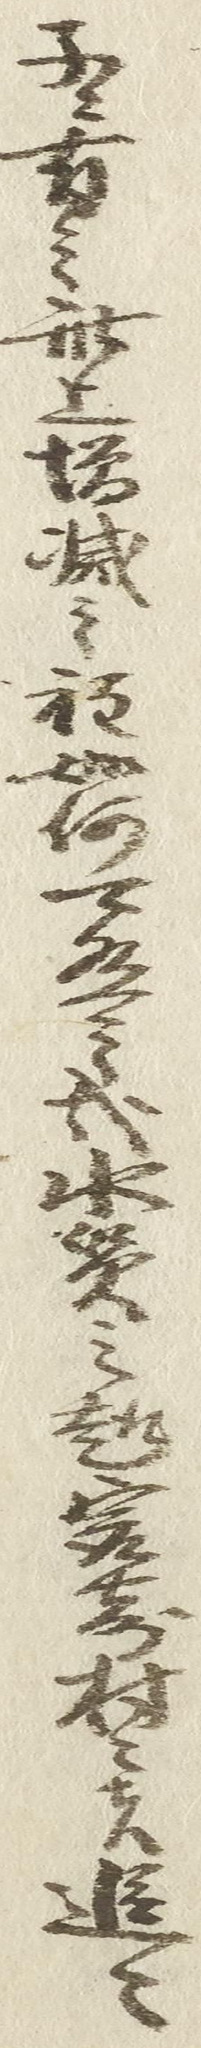子二有之此上増減之程如何可有之哉水災之趣最寄村々は追々
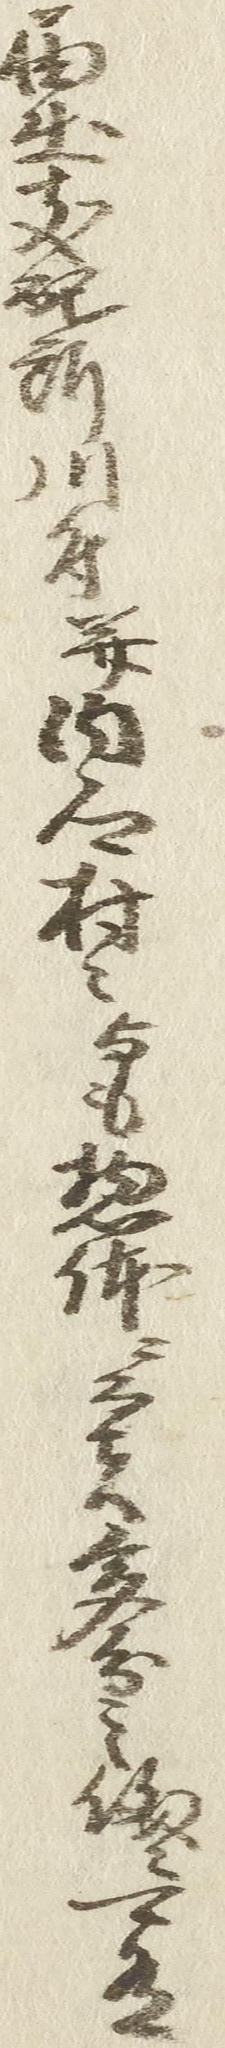届出支配所川付并内郷村々とも惣体二而は多分之儀二可有
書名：従往古地震御届書記誌之一
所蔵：東京大学地震研究所図書室 Earthquake Research Institute Library, The University of Tokyo, JAPAN
